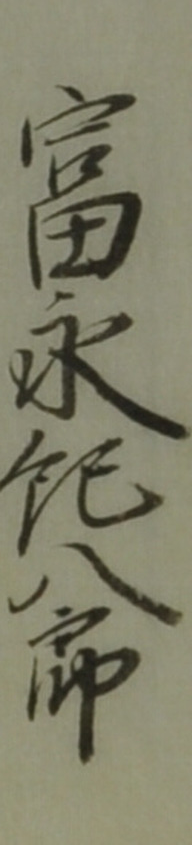富永紀八郎
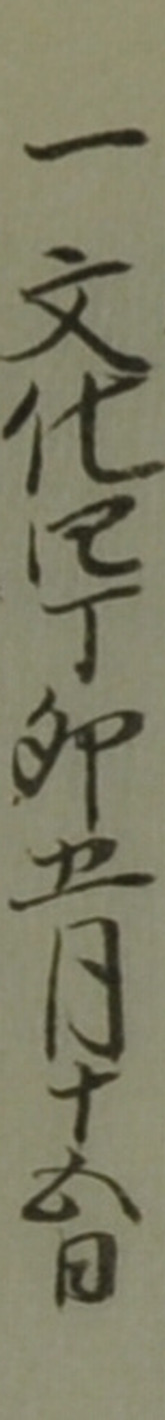一文化四丁卯五月十五日
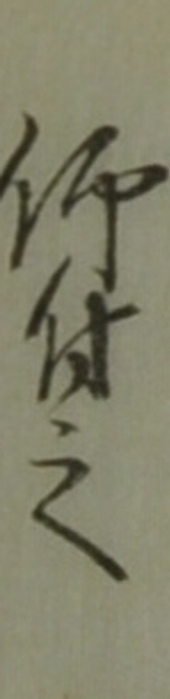仰付之
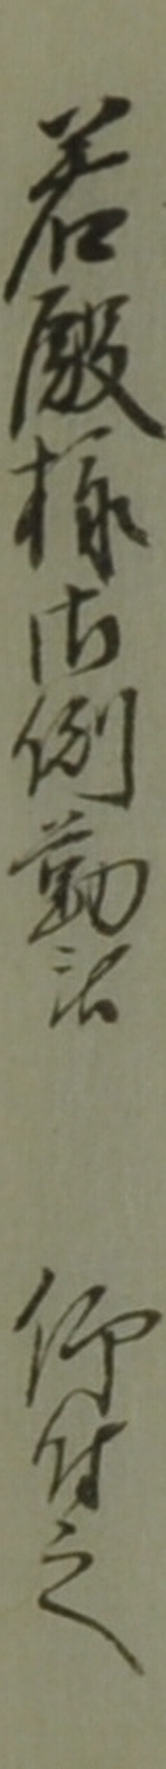若殿様御側勤被仰付之
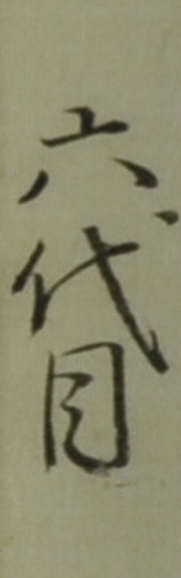六代目

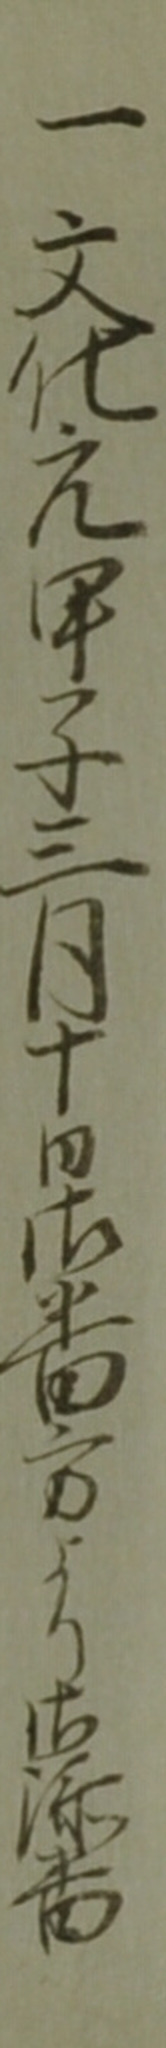一文化元甲子三月十日御番方より御添番
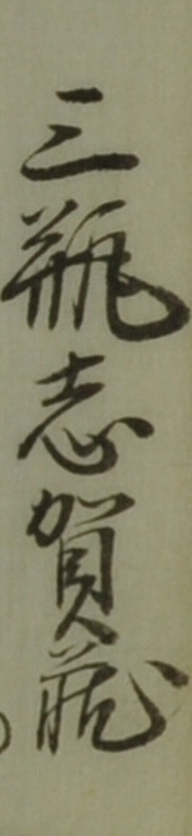三瓶志賀蔵
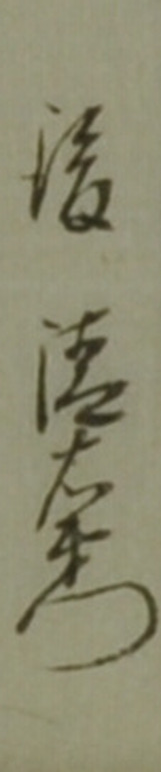後清右衛門
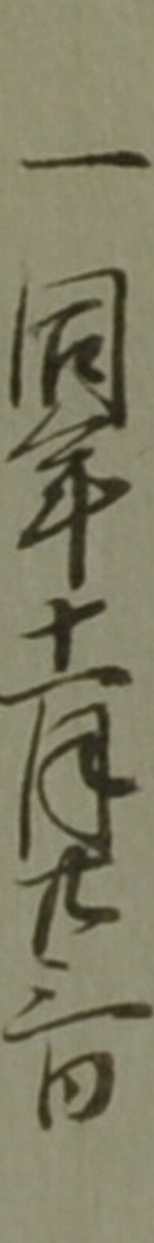一同年十一月廿三日
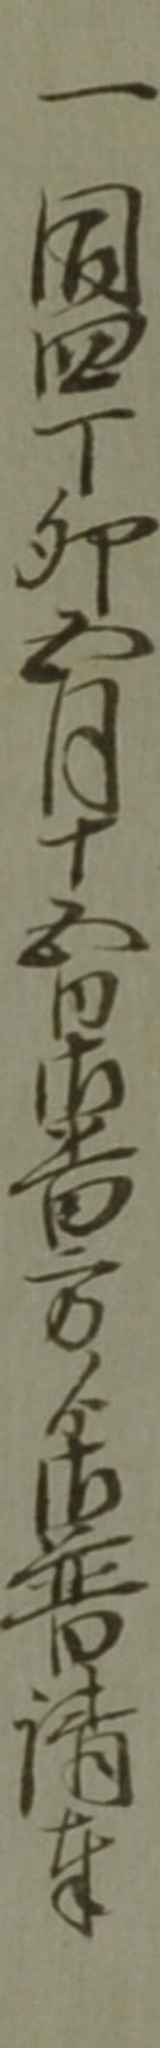一同四丁卯五月十五日御番方より御普請奉
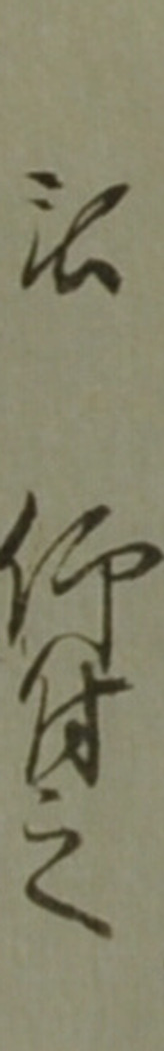被仰付之
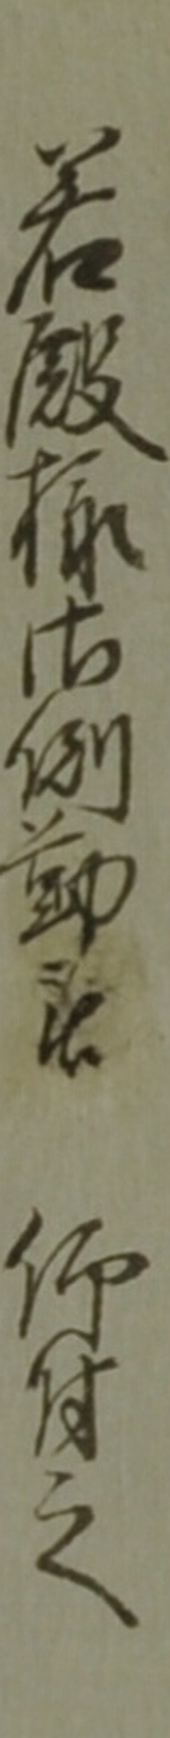若殿様御側勤被仰付之
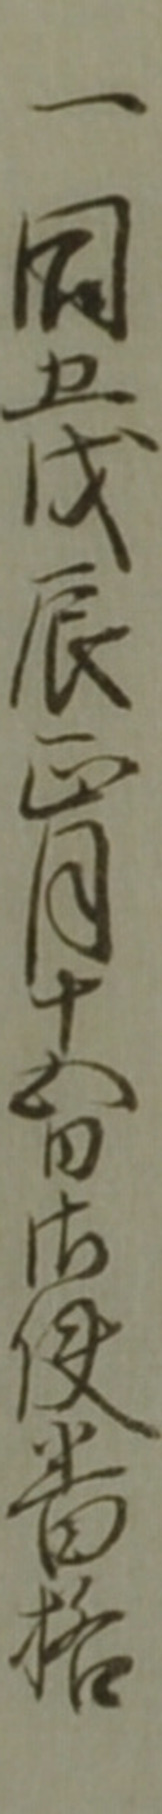一同五戌辰正月十五日御使番格
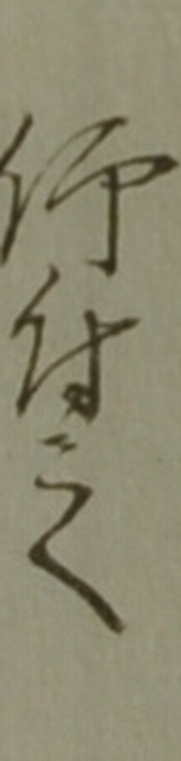仰付之
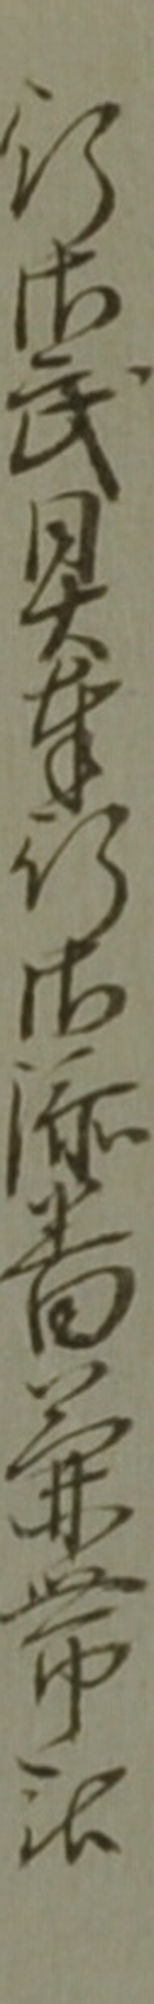行御武具奉行御添番兼帯被
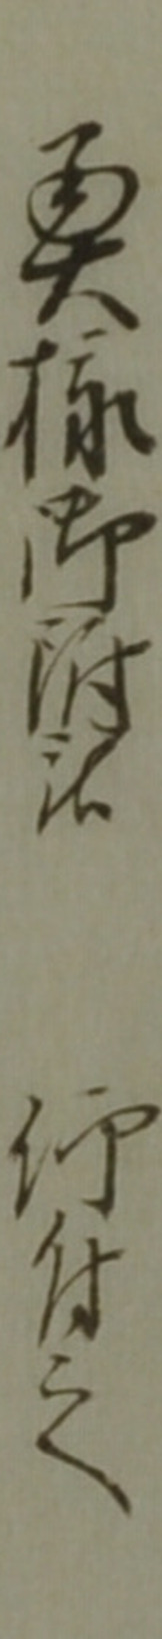奥様御附被仰付之
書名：諸御役代々録（八）
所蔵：伊那市立高遠町図書館・合同会社AMANE
